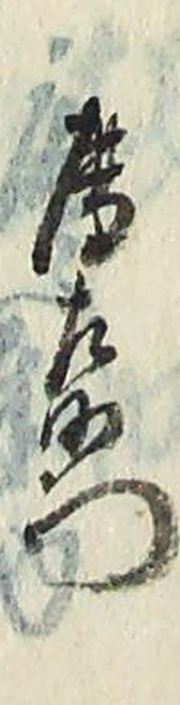鹿左衛門
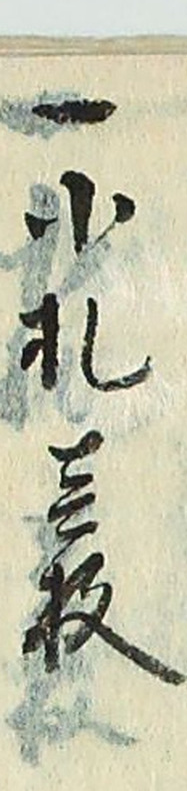一小札壱枚同
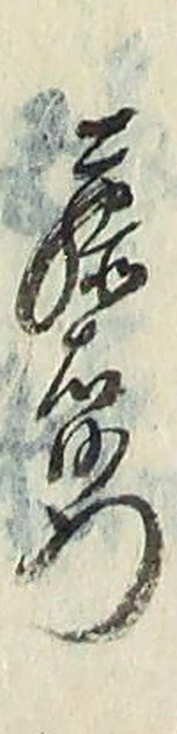藤右衛門
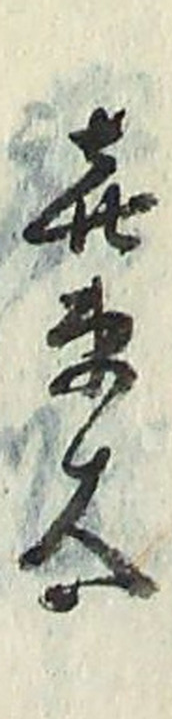喜平太
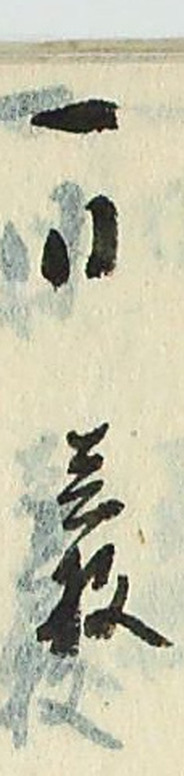一同壱枚同
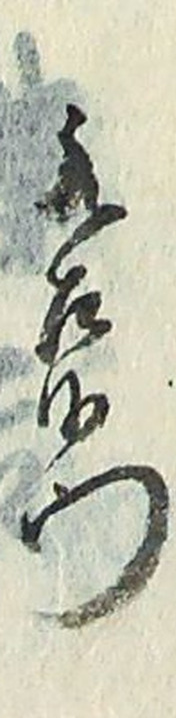鹿左衛門
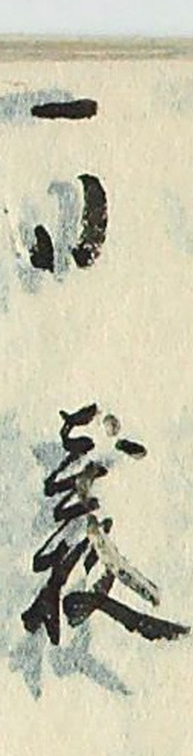一同壱枚同
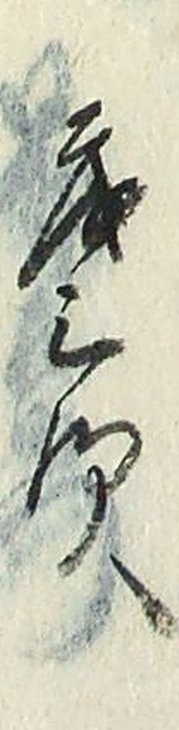茂三次
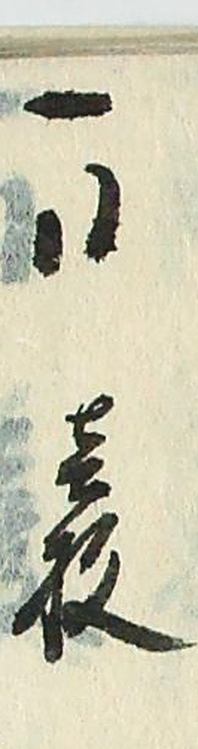一同壱枚同
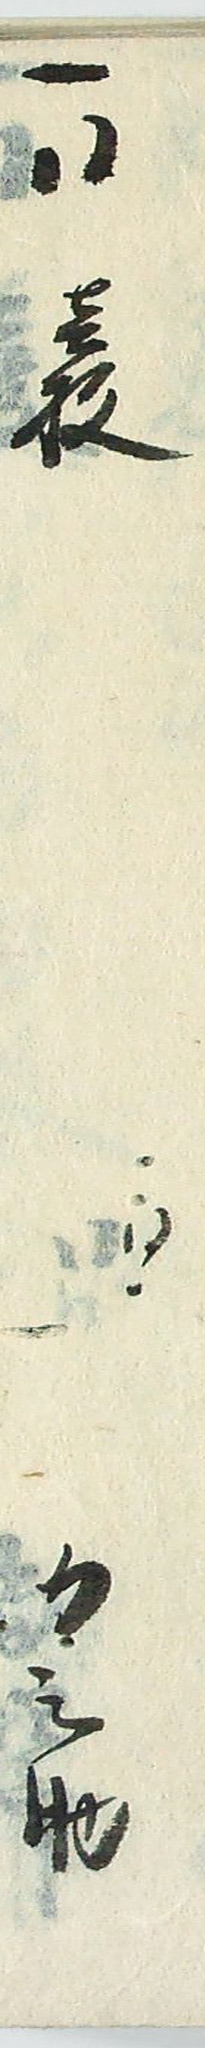一同壱枚同
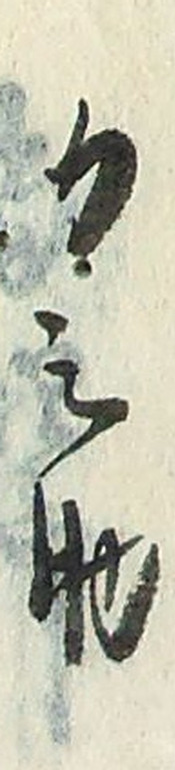為之助

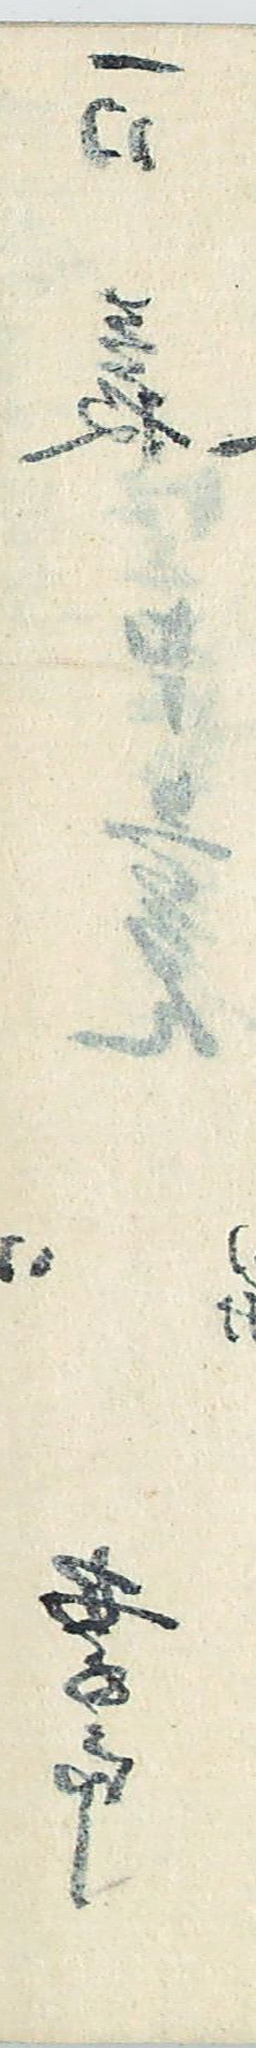一同壱枚同
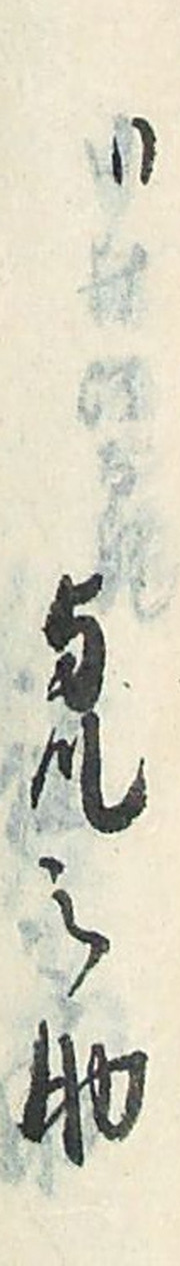虎之助
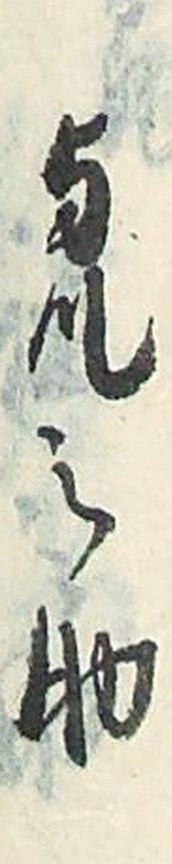虎之助
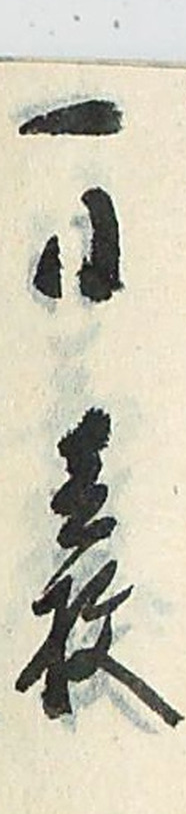一同壱枚同
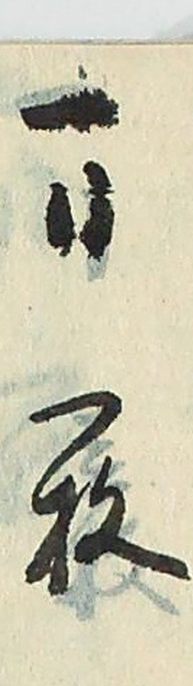一同一枚同
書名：諸御用御□受書控
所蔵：鳴門教育大学 Naruto University of Education
